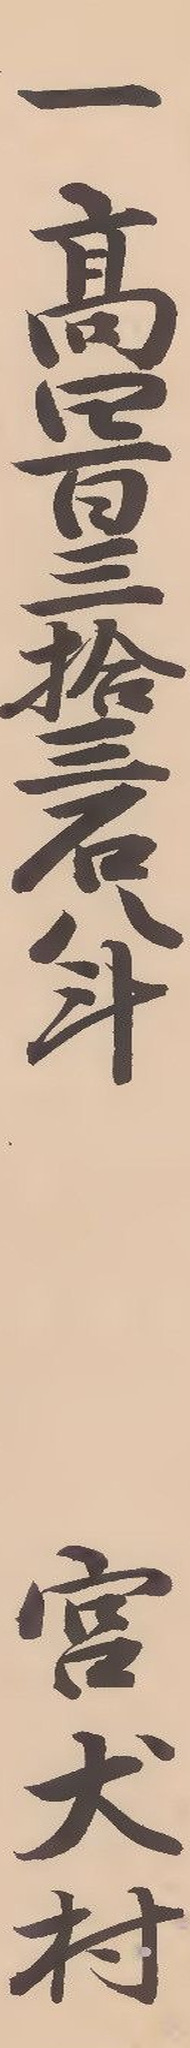一高四百三拾三石八斗宮犬村

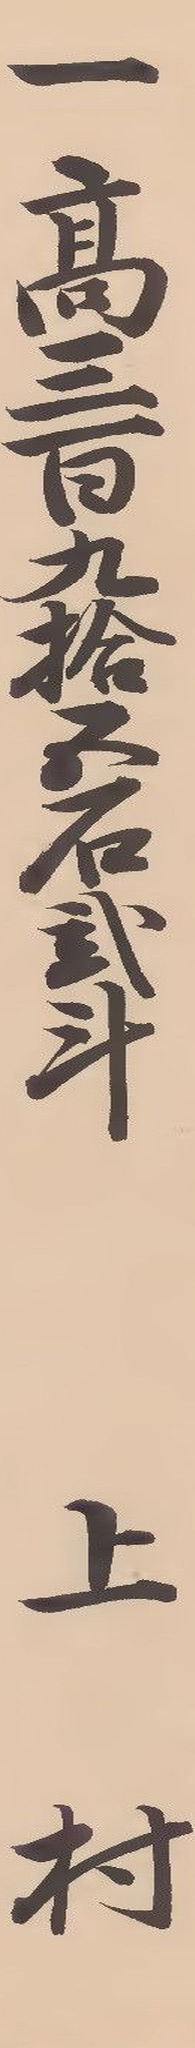一高三百九拾五石弐斗上村
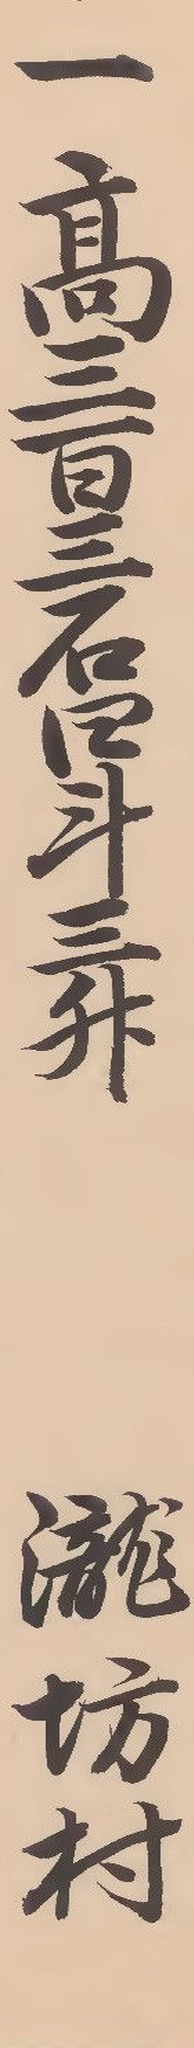一高三百三石四斗三升滝坊村
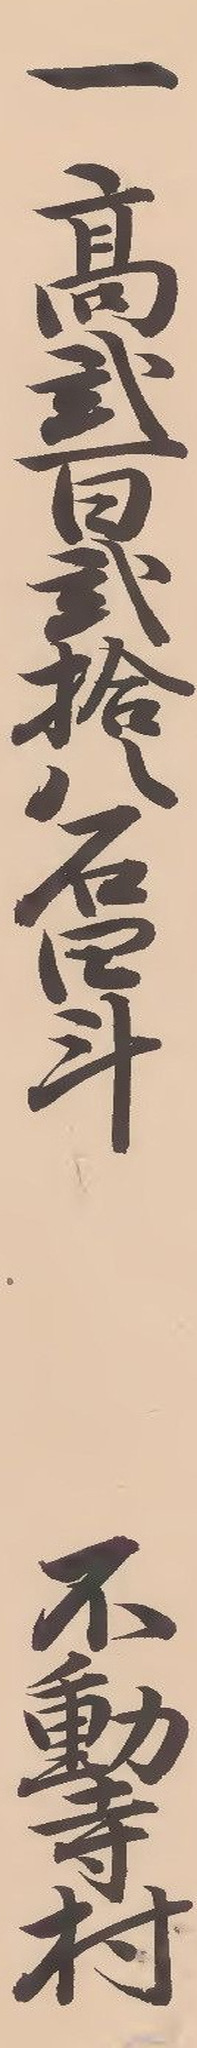一高弐百弐拾八石四斗不動寺村
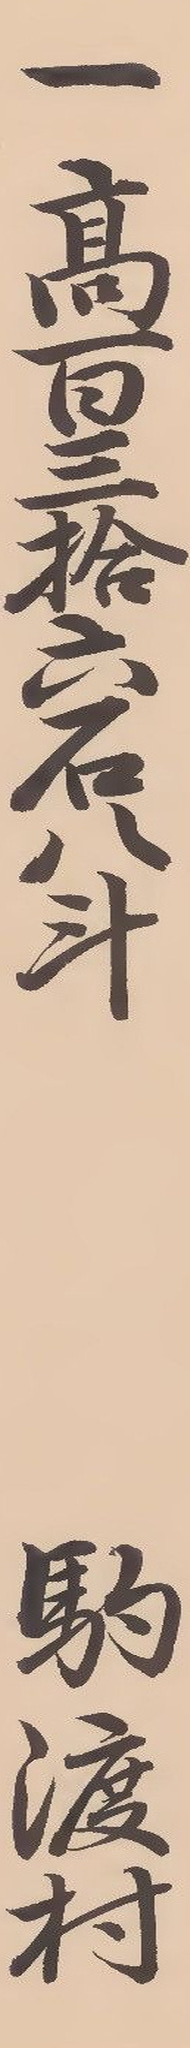一高百三拾六石八斗駒渡村
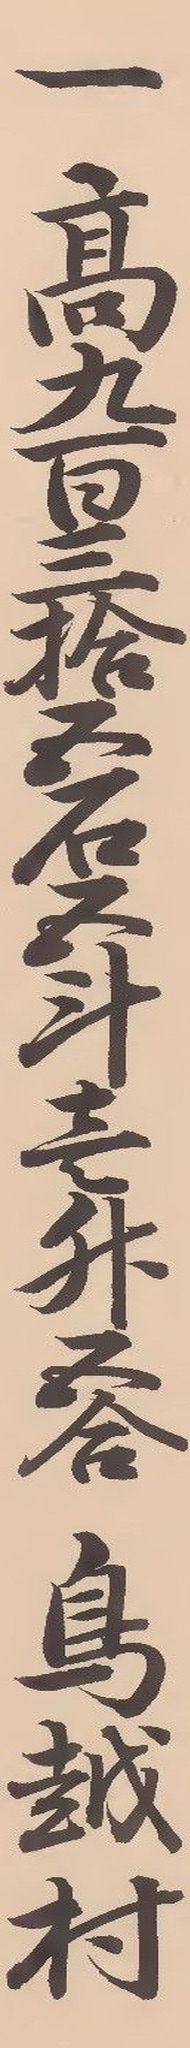一高九百三拾五石五斗壱升五合鳥越村
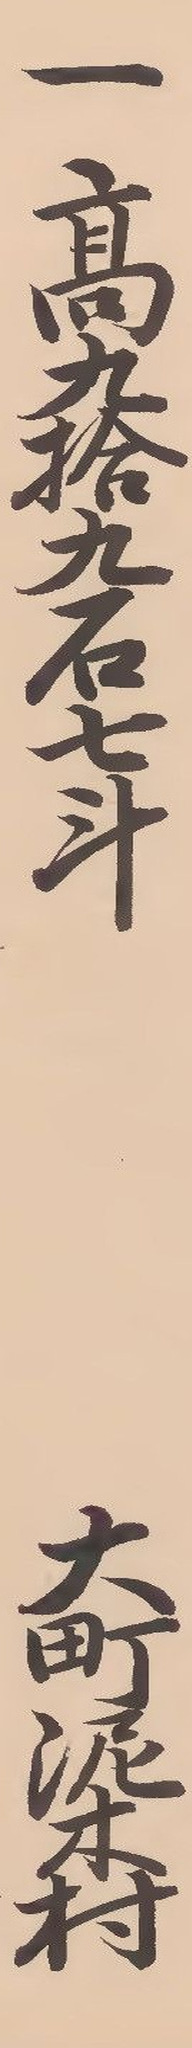一高九拾九石七斗大町泥木村

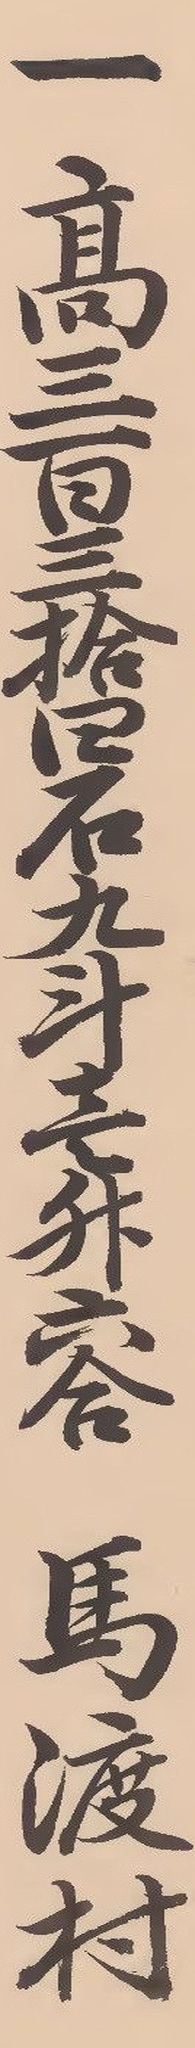一高三百三拾四石九斗壱升六合馬渡村
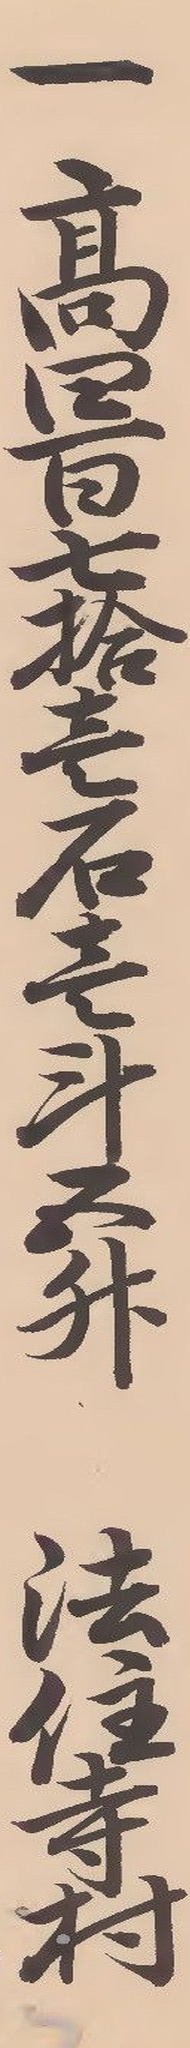一高四百七拾壱石壱斗五升法住寺村
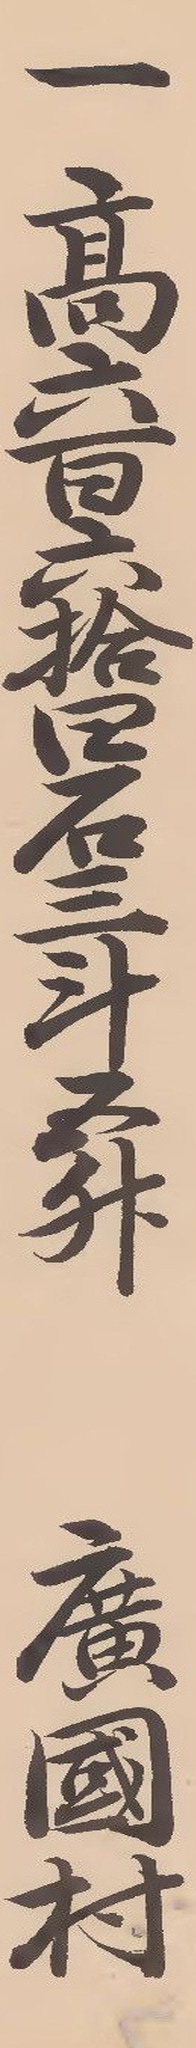一高六百六拾四石三斗五升広国村
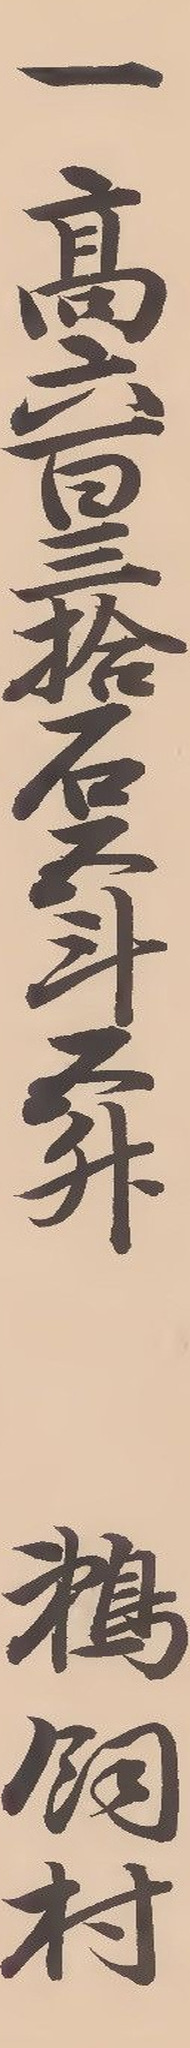一高六百三拾石五斗五升鵜飼村
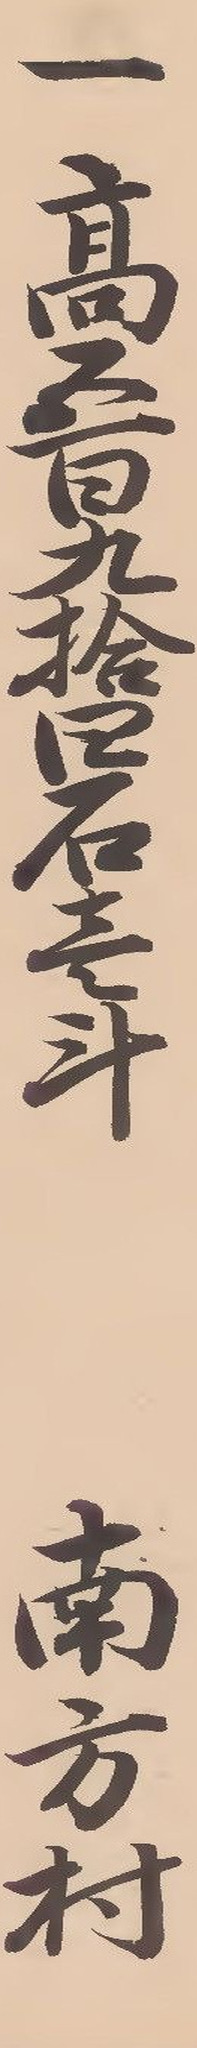一高五百九拾四石壱斗南方村
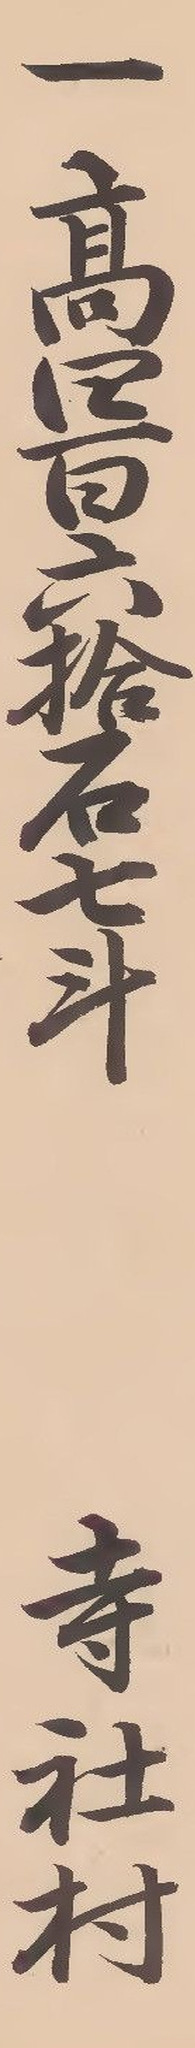一高四百六拾石七斗寺社村

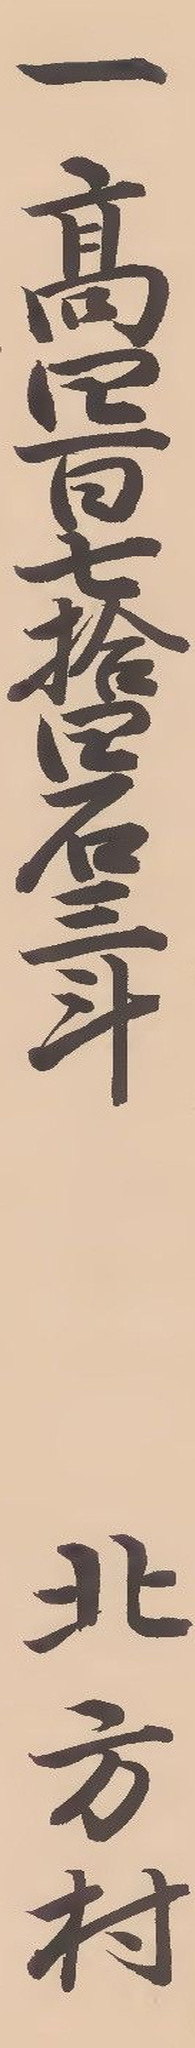一高四百七拾四石三斗北方村
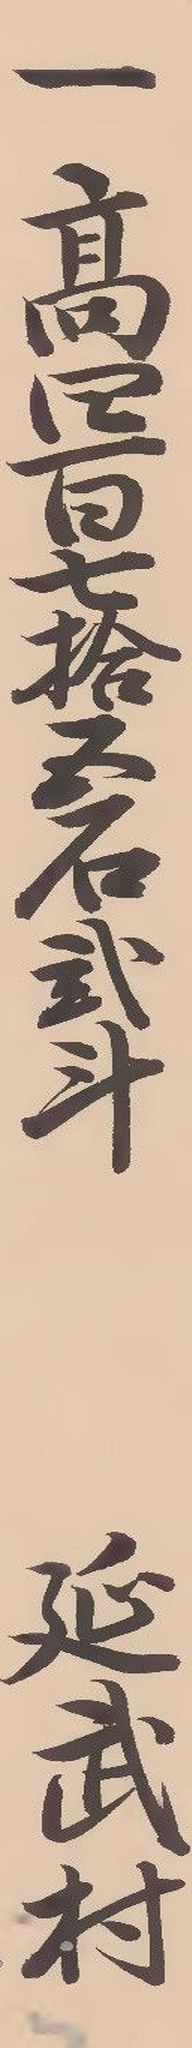一高四百七拾五石弐斗延武村
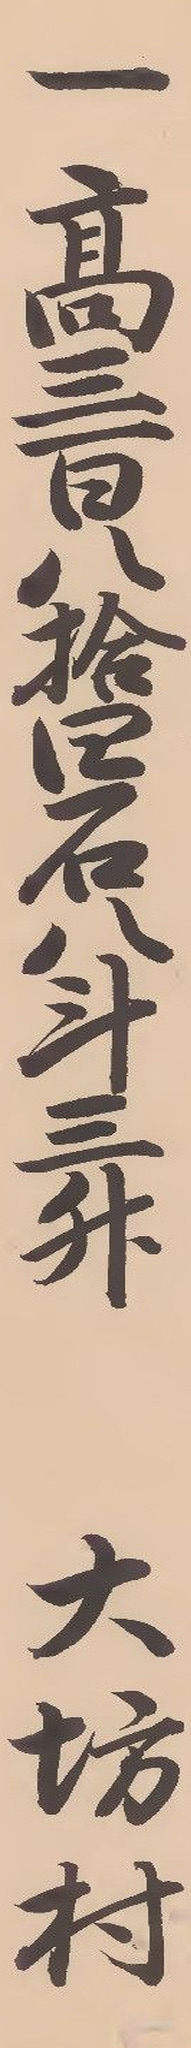一高三百八拾四石八斗三升大坊村
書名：能登国郷帳
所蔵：国立公文書館 National Archives of Japan
